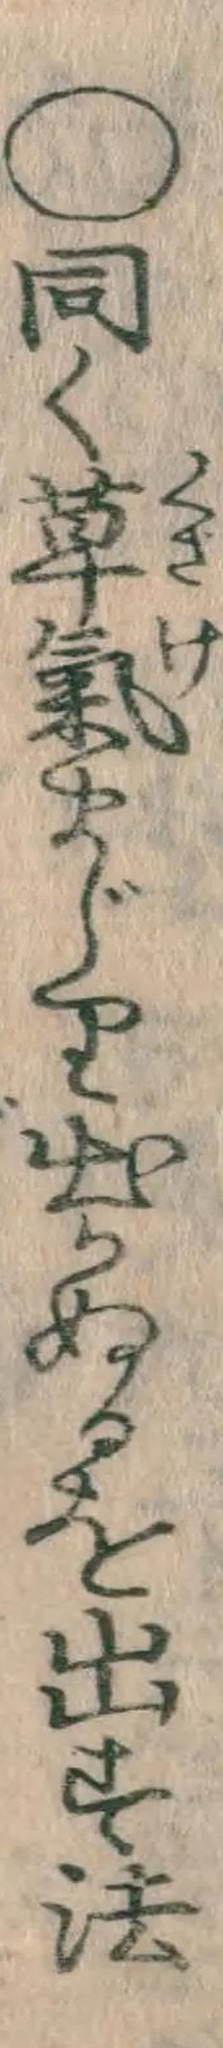○同く草気まじり出かぬるを出す法
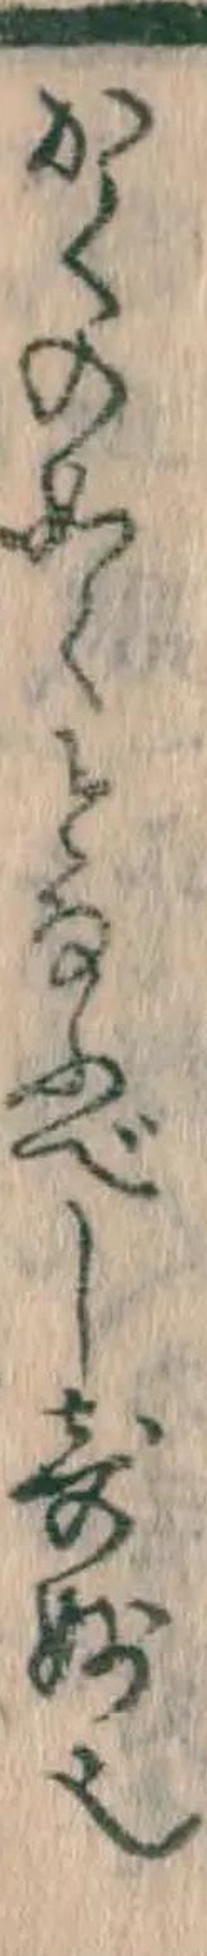かくの如くとなふべし奇妙也
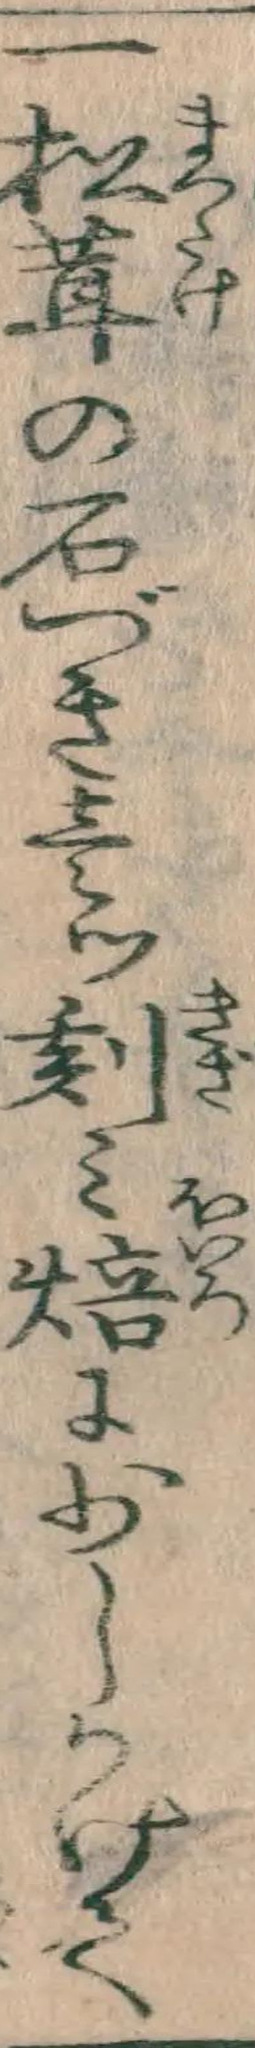一松茸の石づき壱ッ刻み焙に少しかけて
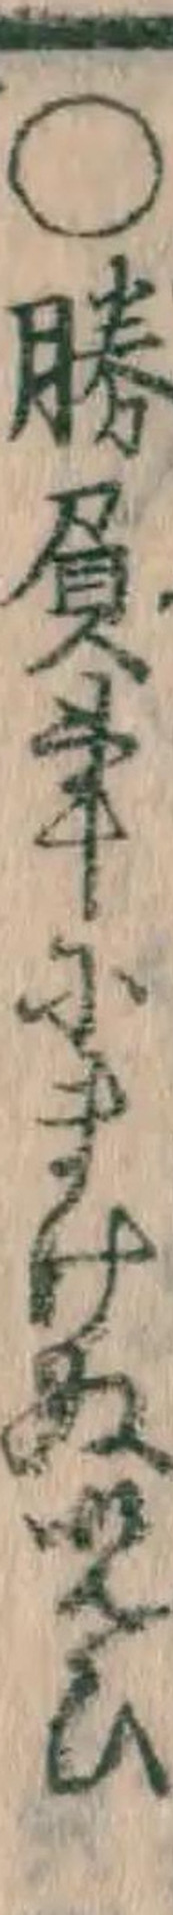○勝負事にまけぬ呪ひ
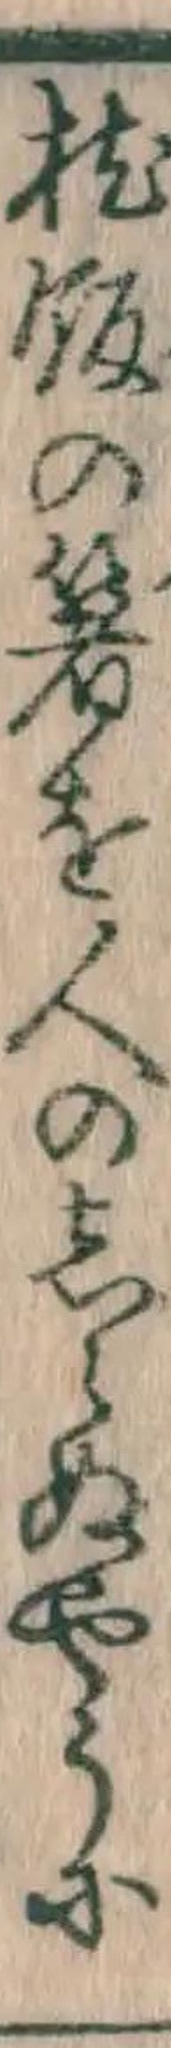枕飯の箸を人のしらぬやうに
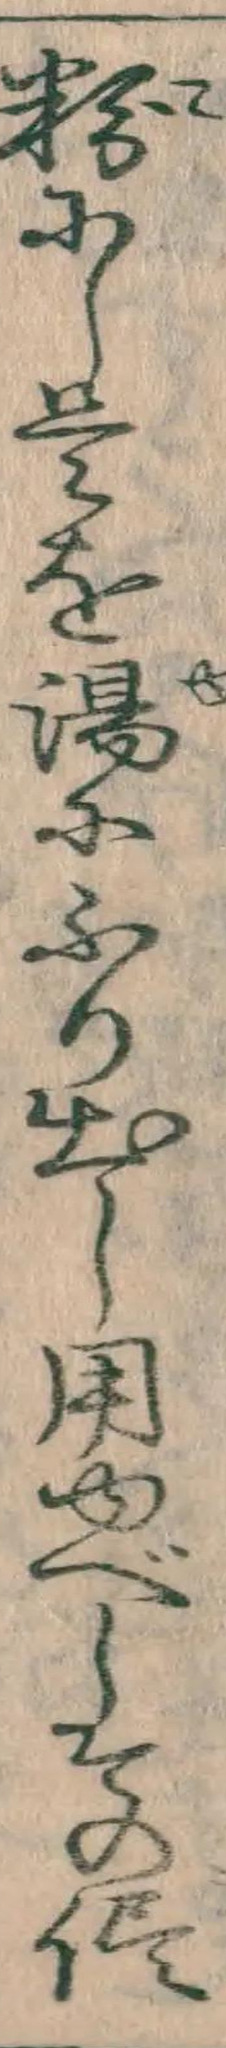粉にし是を湯にふり出し用ゆべしその儘
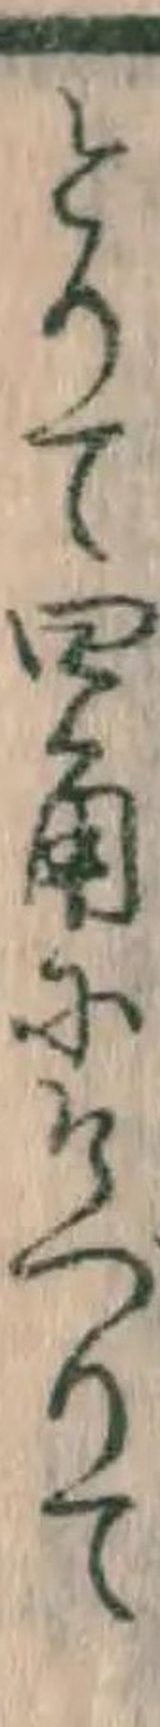とりて四角にけづりて
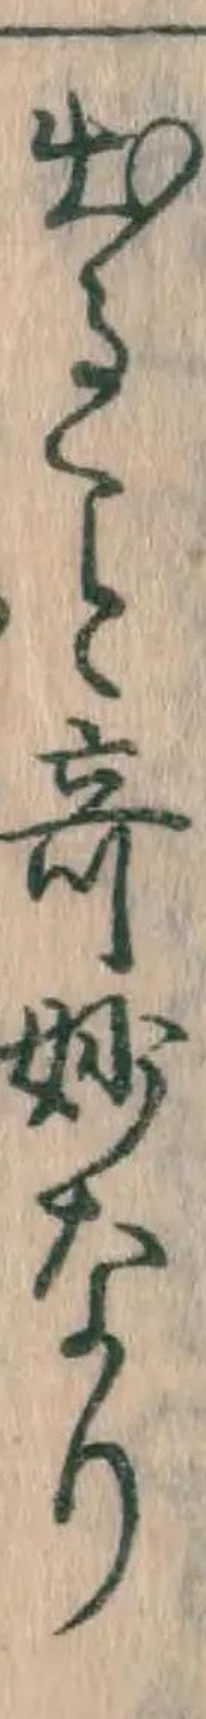出ること奇妙なり
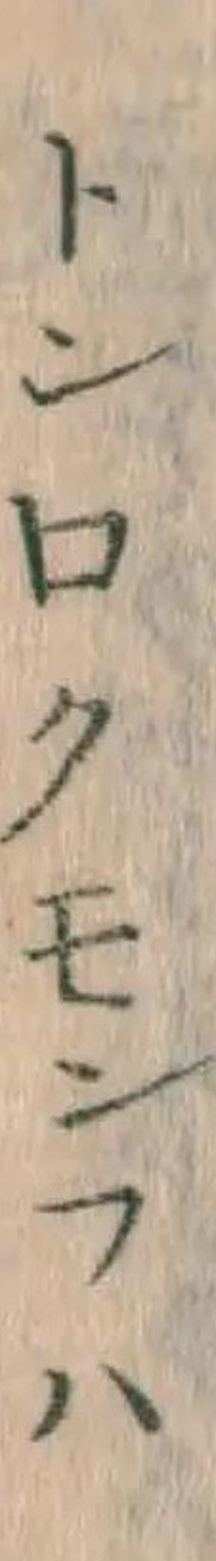トンロクモンフハ
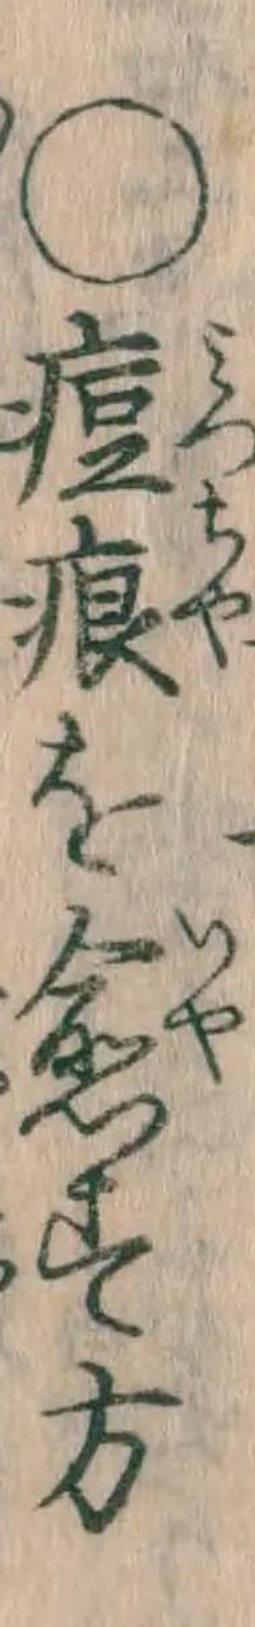○痘痕を愈す方
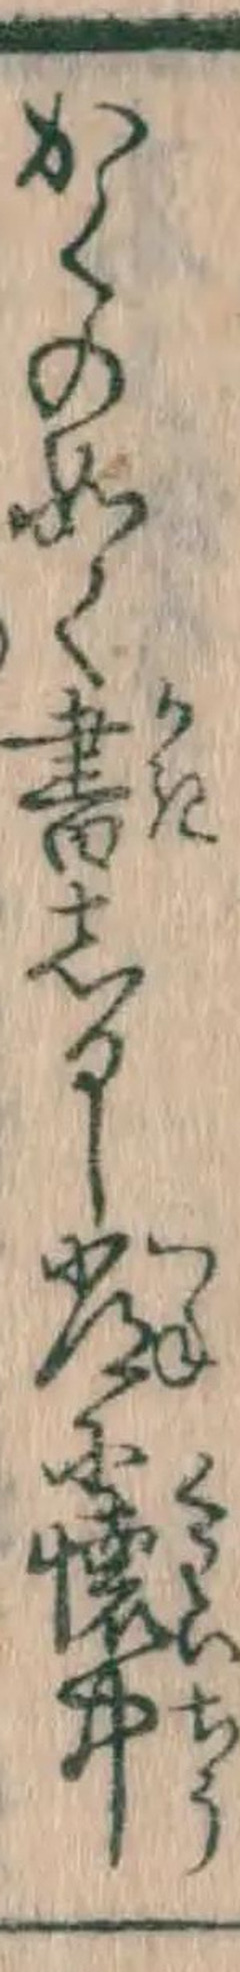かくの如く書しるし常に懐中
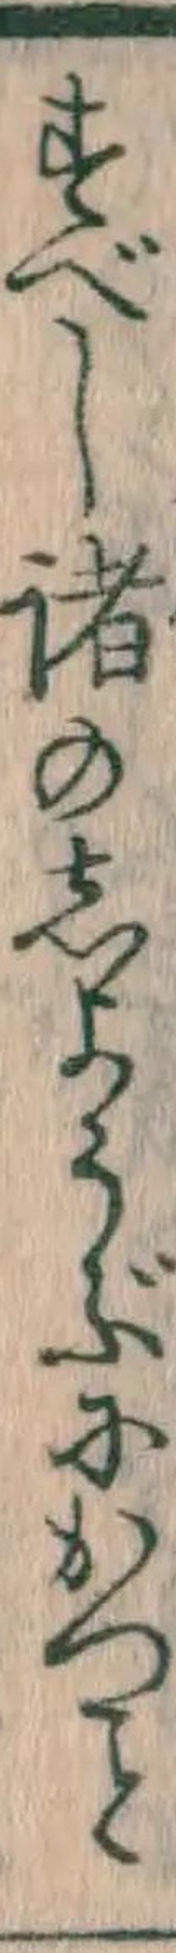すべし諸のしようぶにかつこと
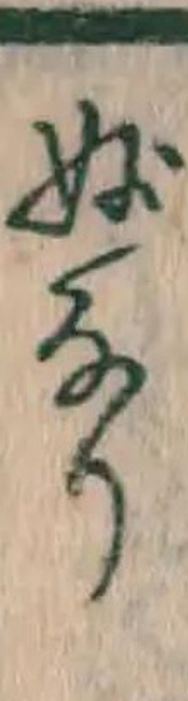妙なり
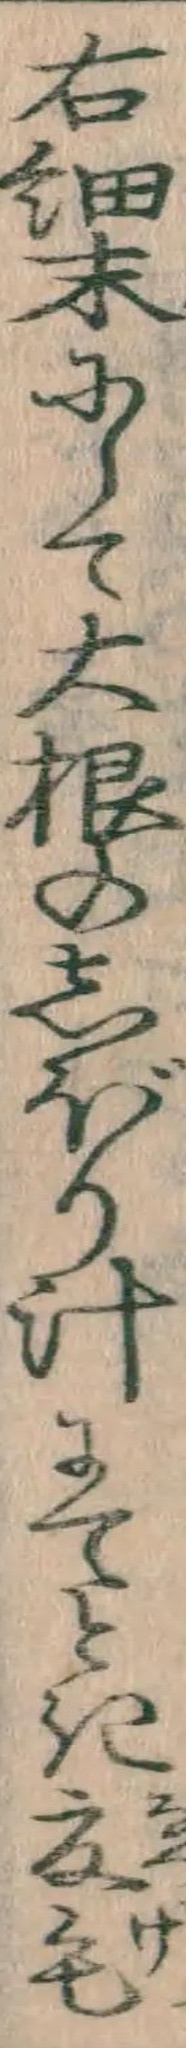右細末にして大根のしぼり汁にてとき夏毛
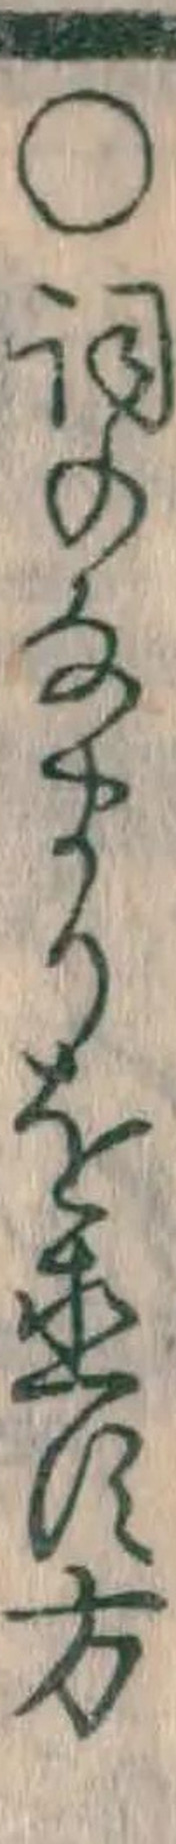○詞のなまりを直す方
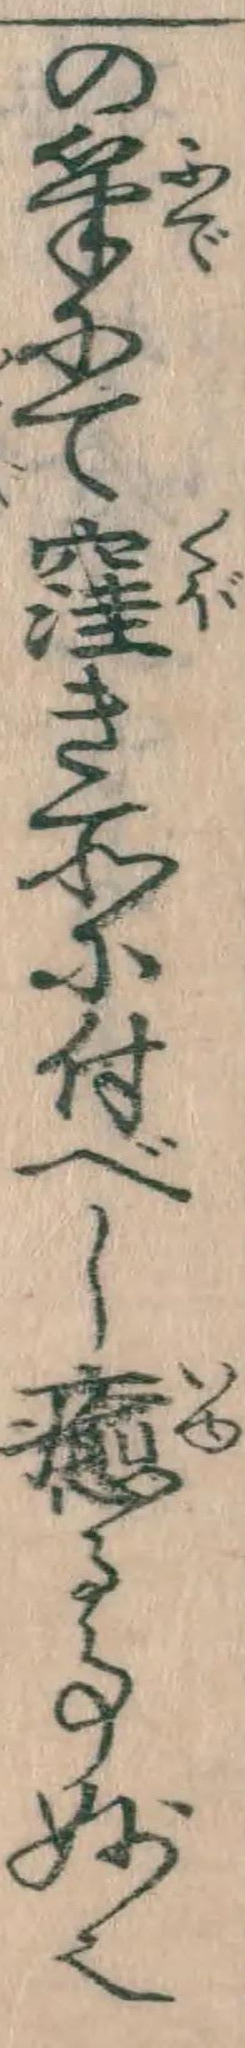の筆にて窪き所に付べし癒る事妙也
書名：広益秘事大全 3巻. [4]
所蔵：国立国会図書館 National Diet Library, JAPAN
